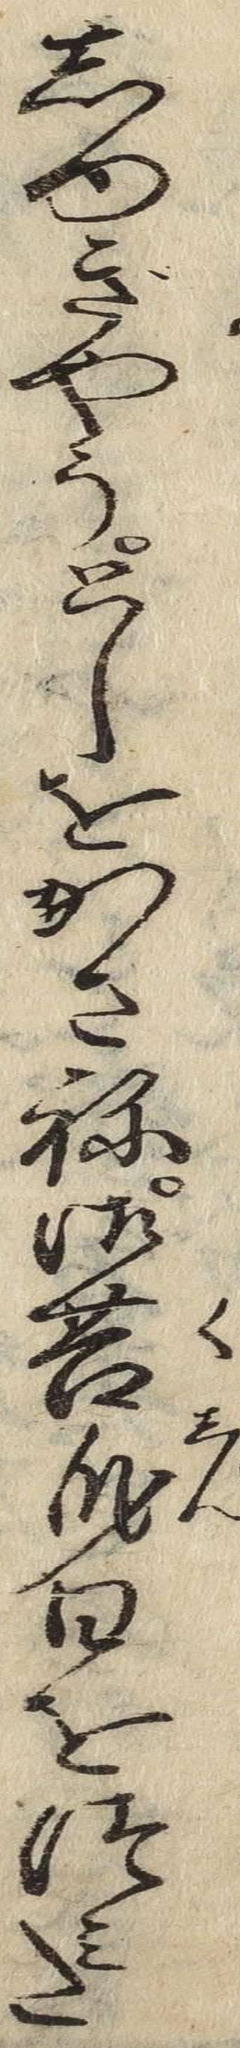しゆぎやう。としをかさね。御苦身日をつみた
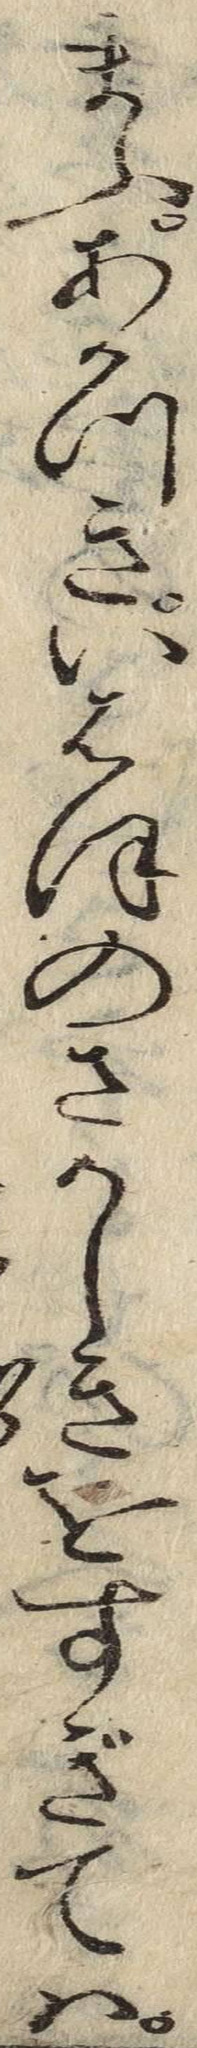まふ。あかつき。いはほのさかしきをすぎては。
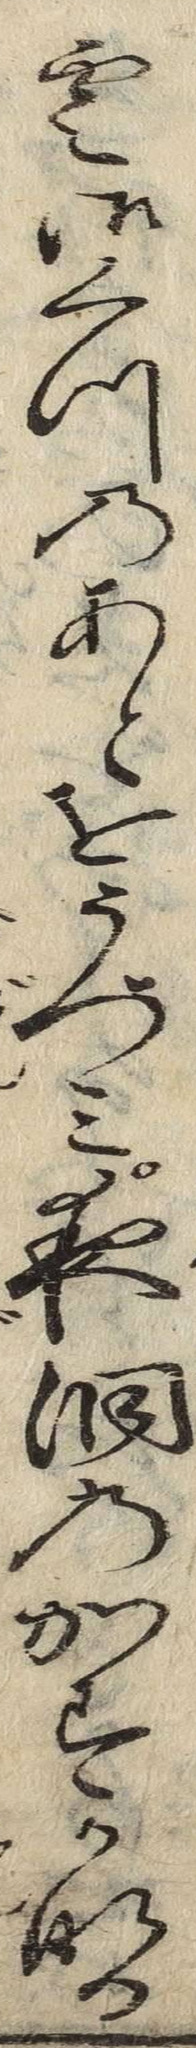雪御くつのあとをうづみ。夜洞のかすかなる
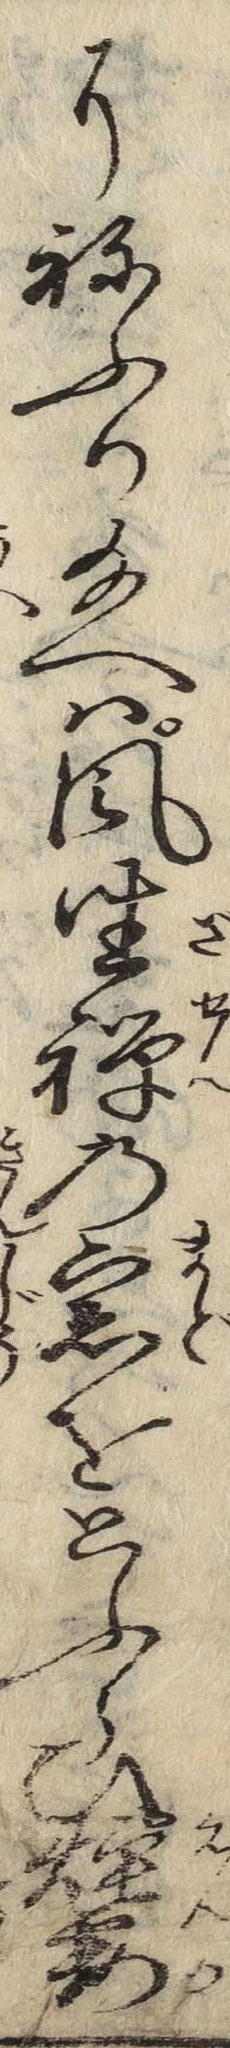にねふり給へは。風座禅の窓をとふらひ煙香
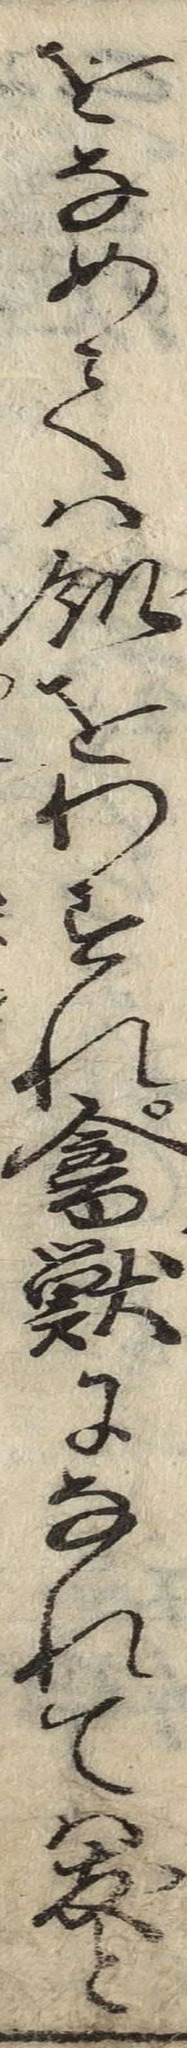をなめては餓をわすれ。禽獣になれては友と
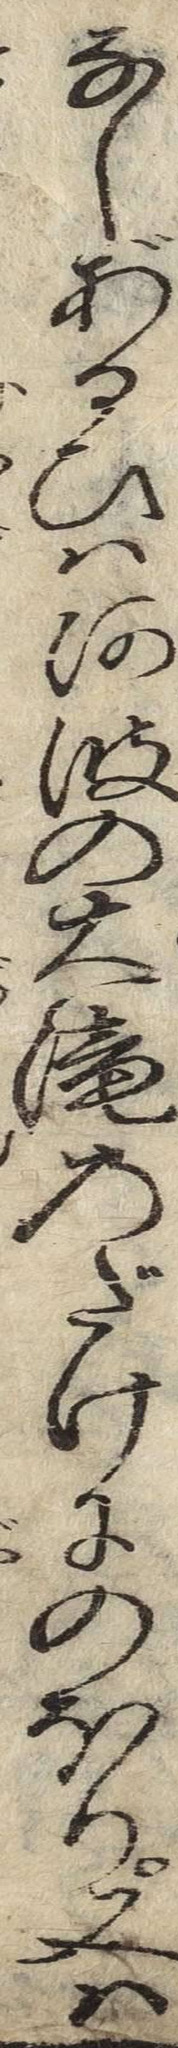なし。あるひは阿波の大滝のだけにのほり。又は
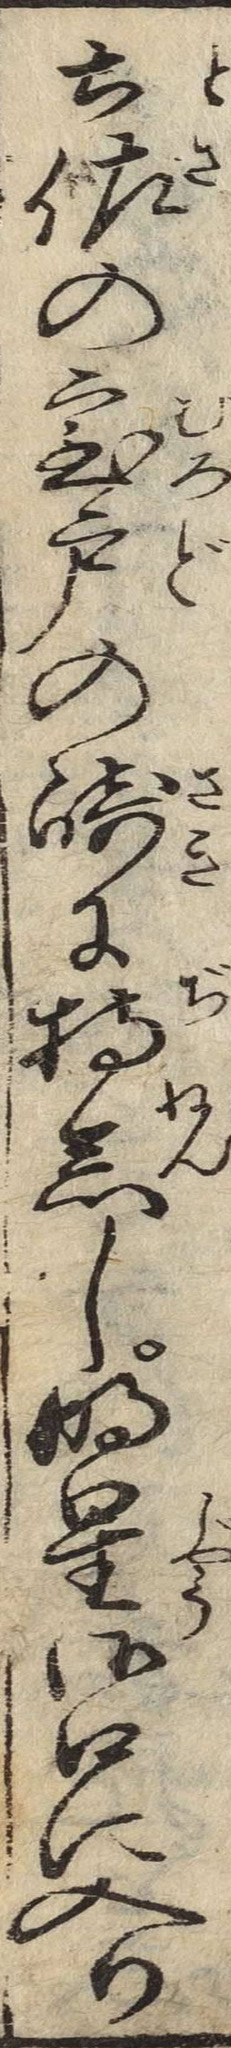土佐の室戸の崎に持念し。明星御口に入り

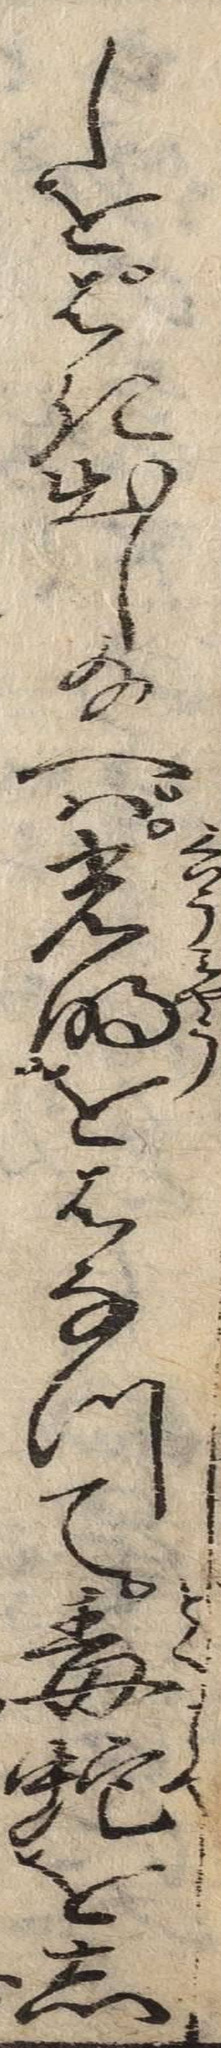しを。はき出し給へば。光明をはなつて。毒蛇をし
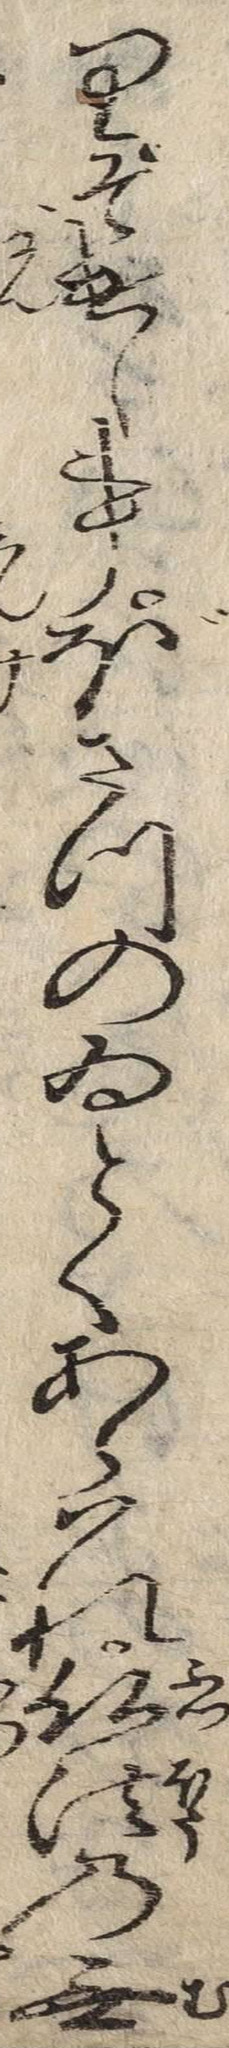りぞけし事。ぼさつのゐとくあらはれ仏法の無
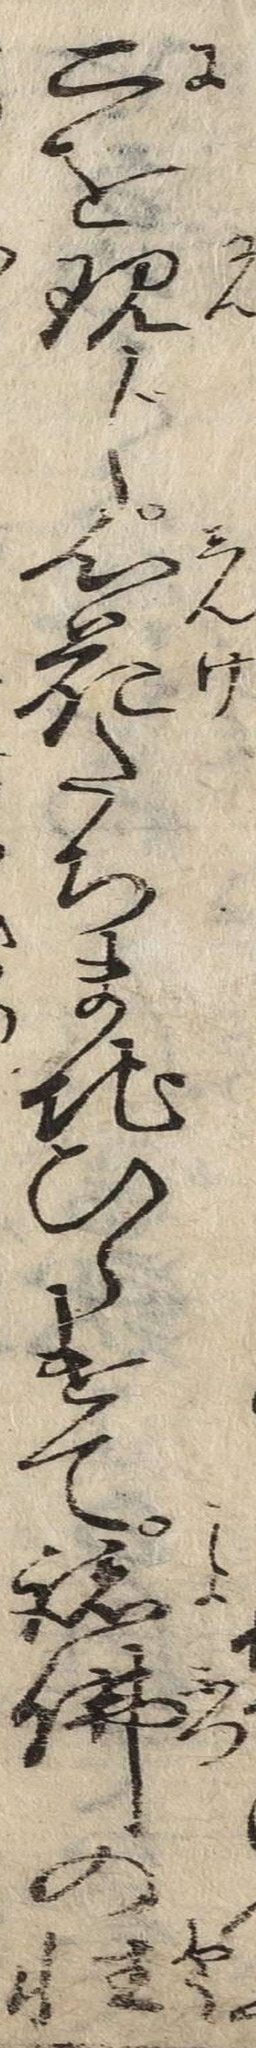二を現し。心花たちまちひらけて。諸仏の性
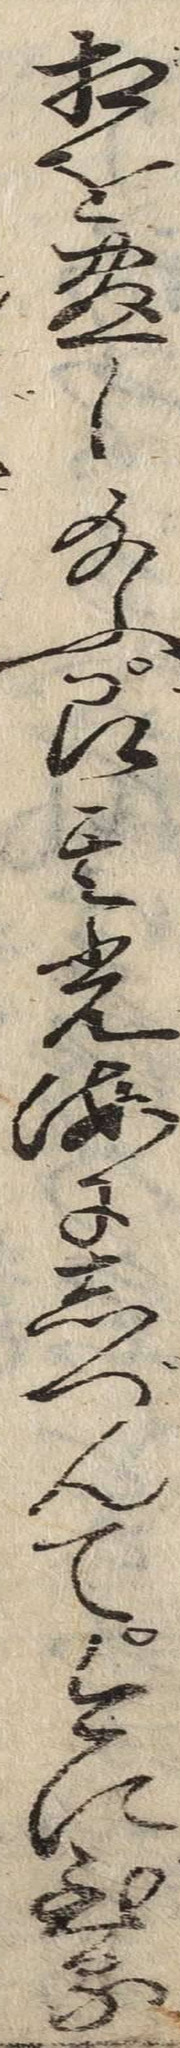相を尽し給ふ。即其光海にしづんて。今に至る
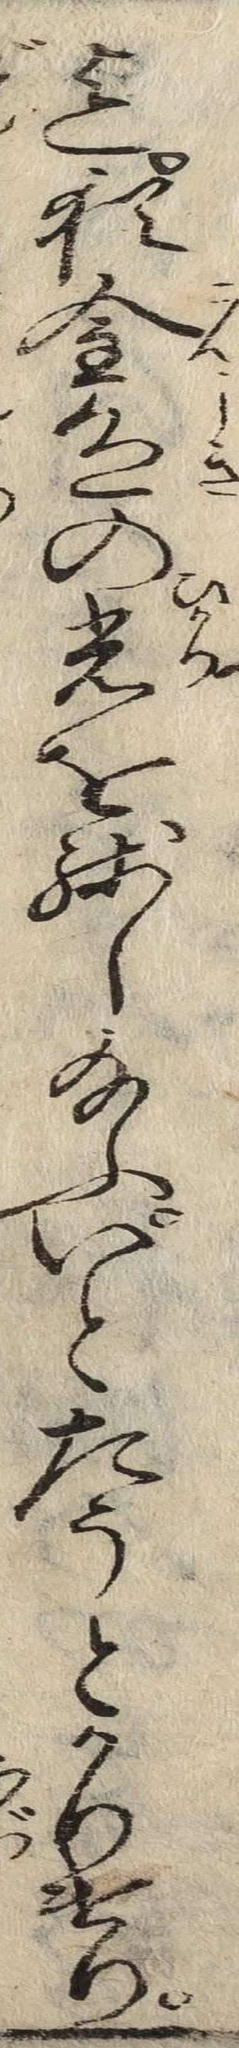迄。猶金色の光を残し給ふ。いとたうとかりけり。
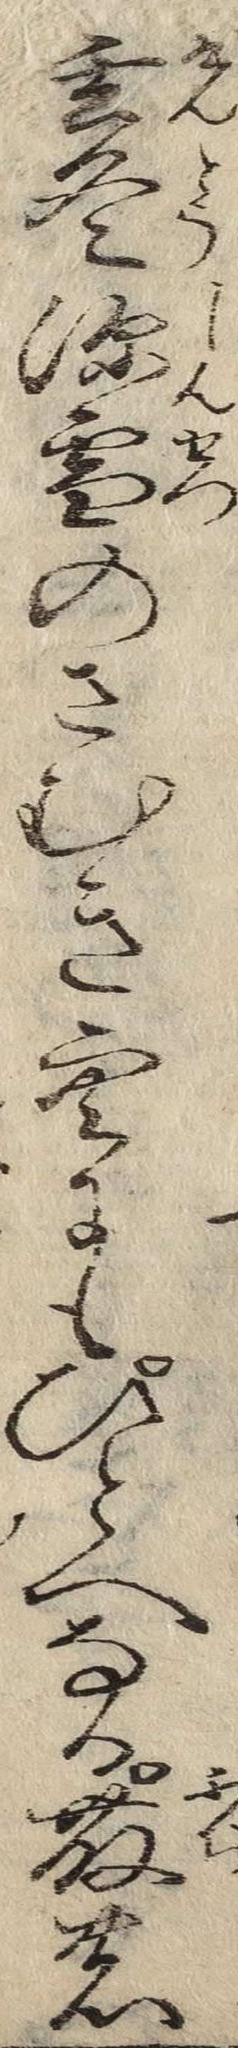玄冬深雪のさむき空にもひとへなる。藤の
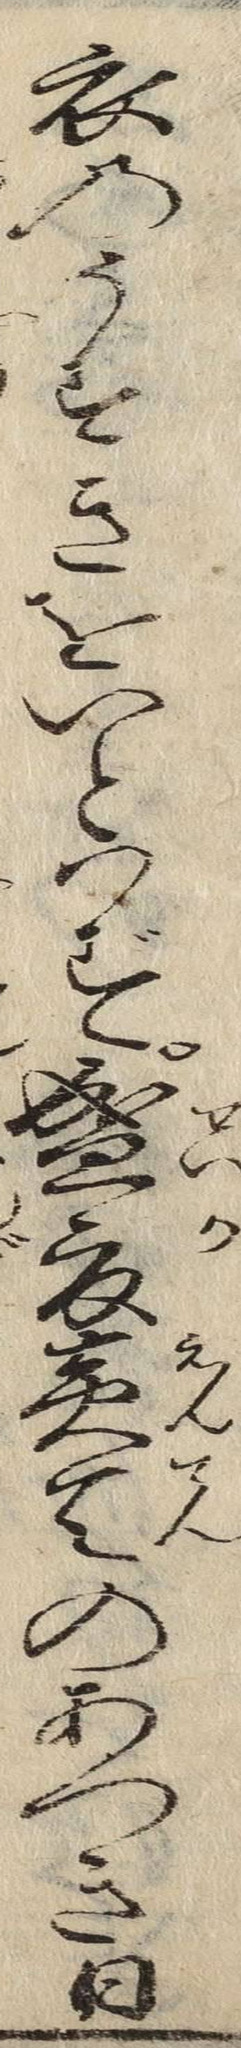衣のうすきをいとはず。盛夏炎天のあつき日
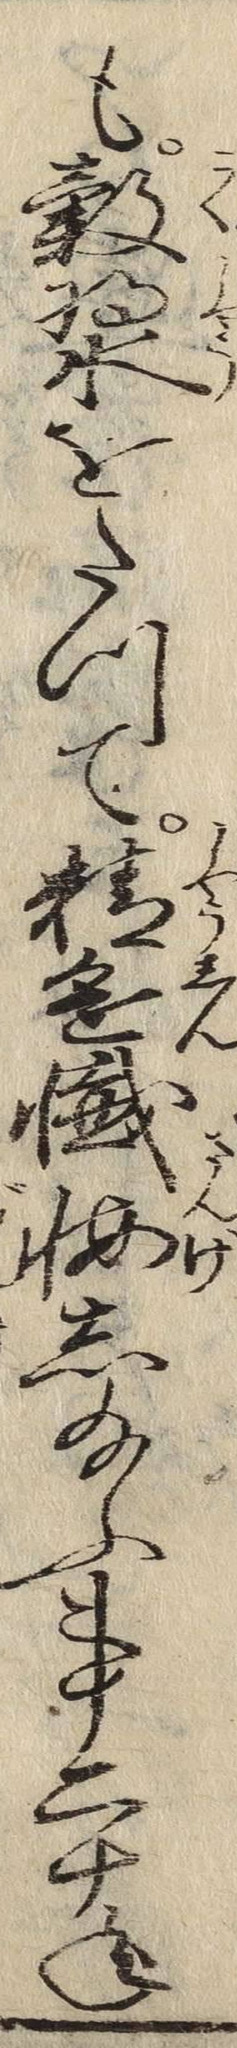も。穀漿をたつて。精進懺悔したまふ事二十年
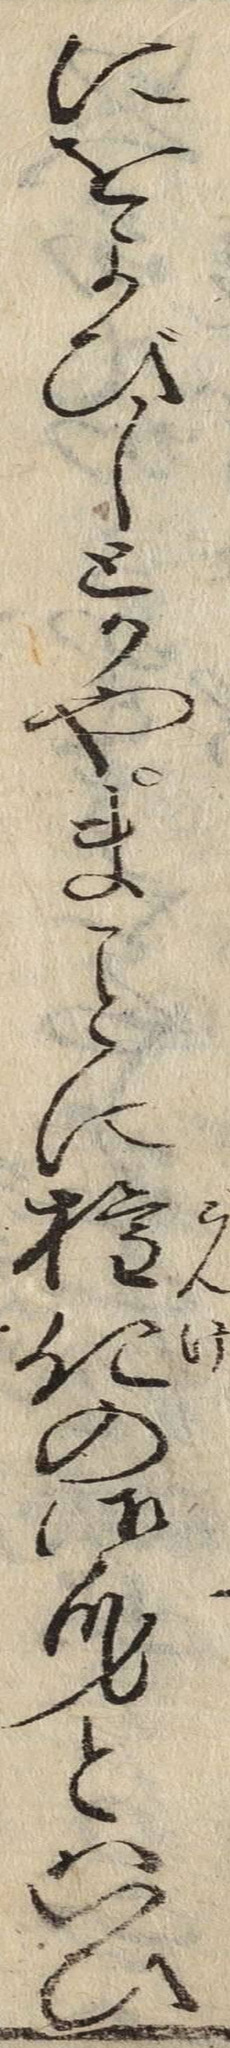におよびしとかや。まことに権化の御身とはいひ
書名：弘法大師御傳記
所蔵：京都府立京都学・歴彩館 国文学研究資料館
